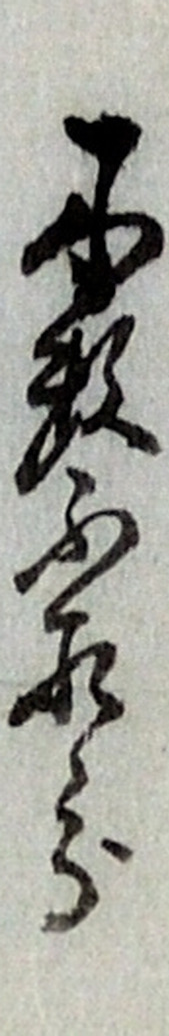木数不相分
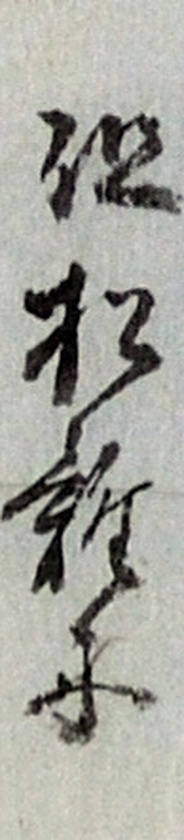但松雑木
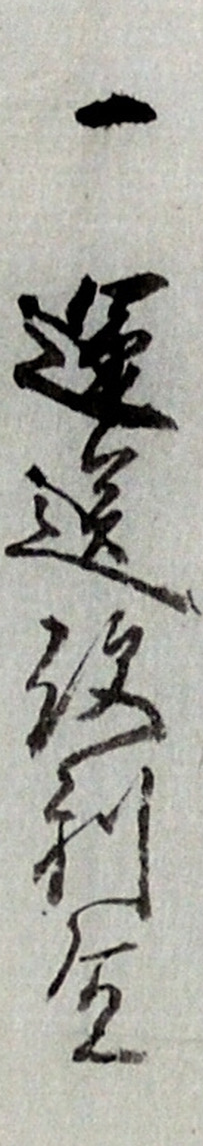一運送便利宜
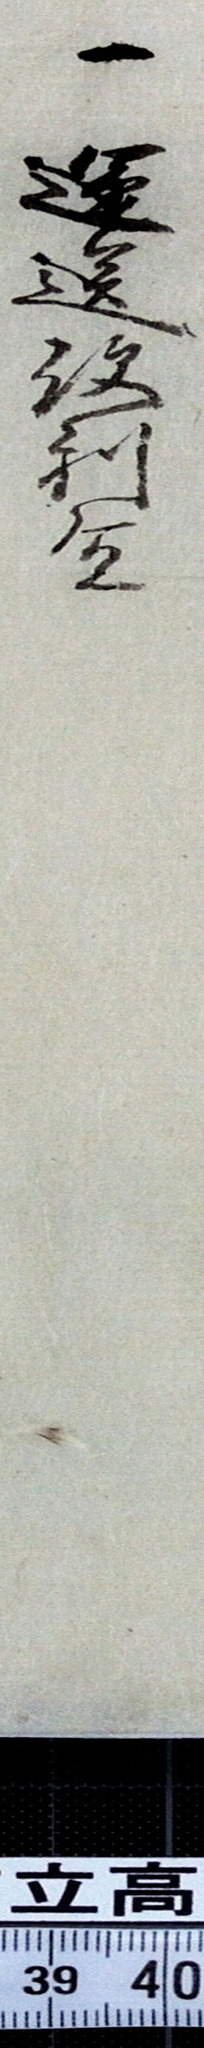一運送便利宜
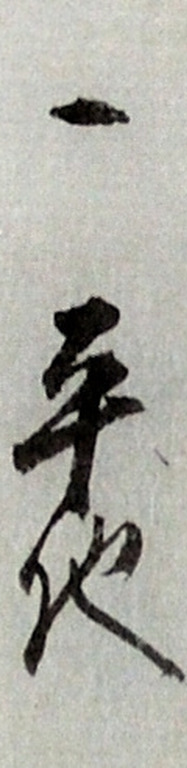一平地

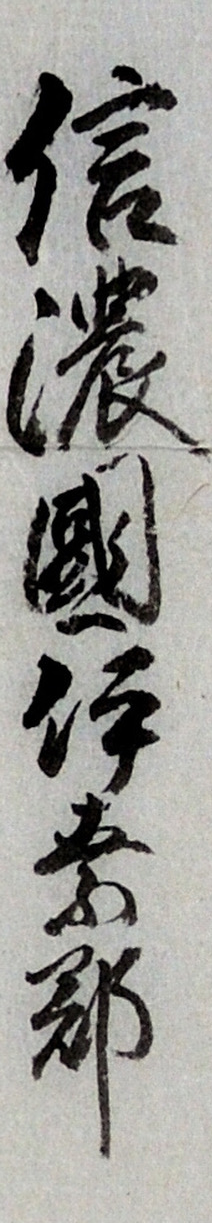信濃国伊那郡
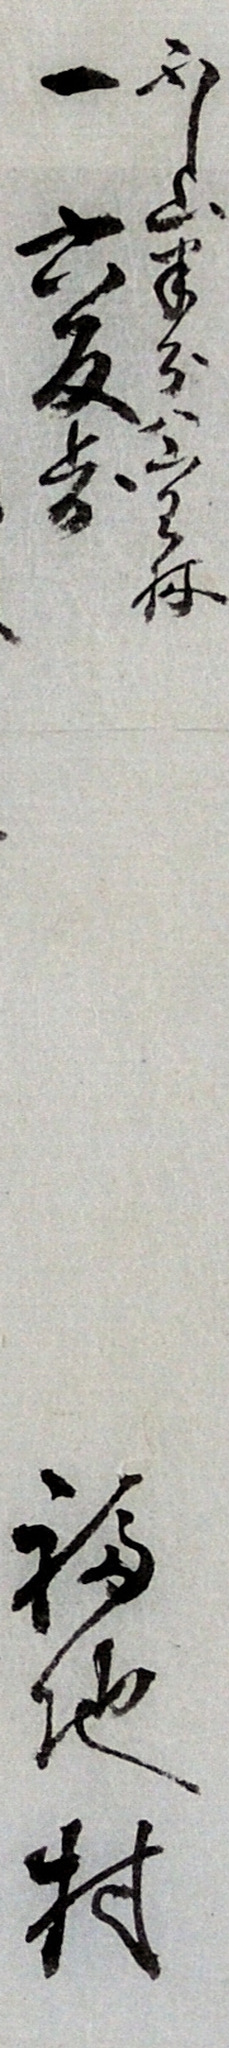一六反歩福地村
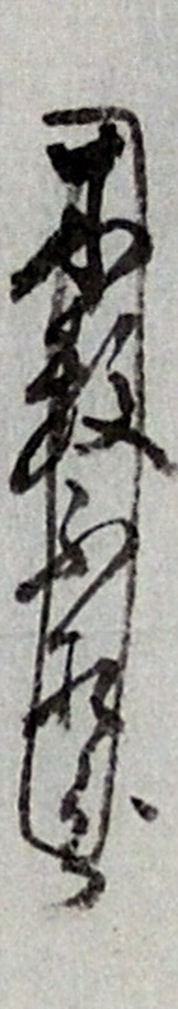木数不相分
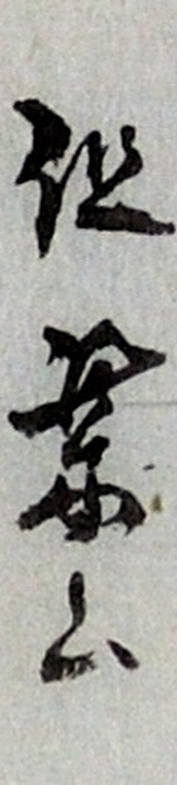但柴山
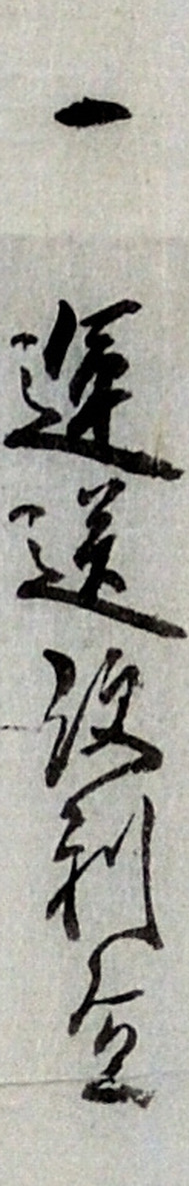一運送便利宜
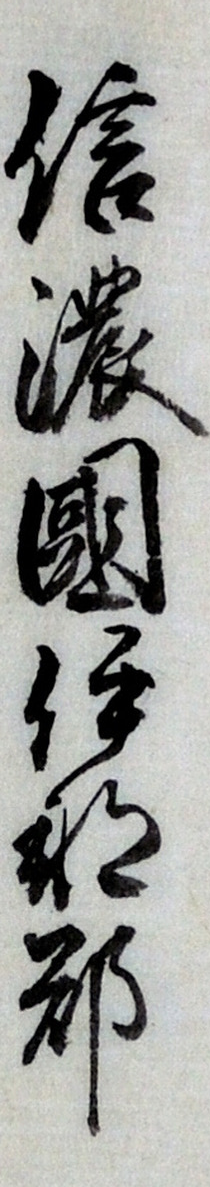信濃国伊那郡
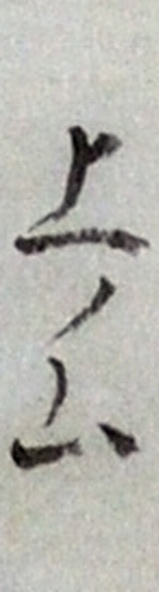上ノ山
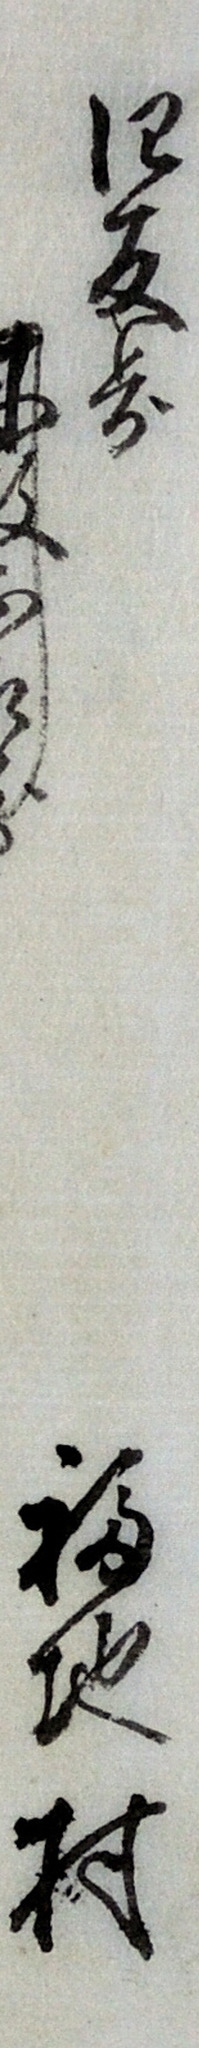一四反歩福地村
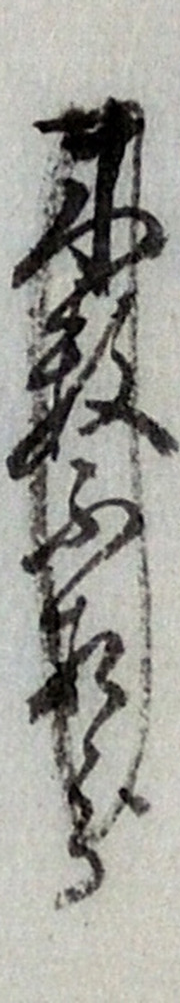木数不相分
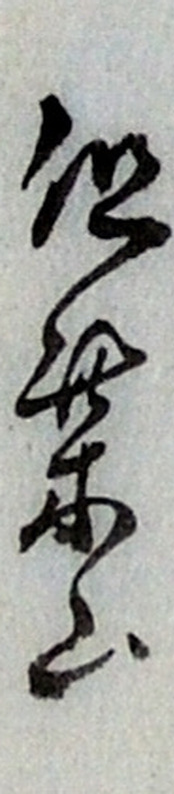但柴山
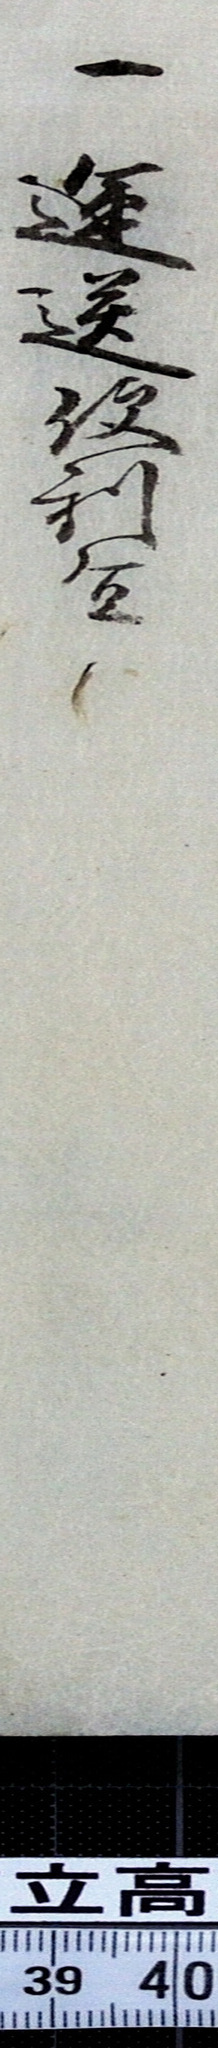一運送便利宜
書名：官林反別帳
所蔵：伊那市立高遠町図書館・合同会社AMANE
